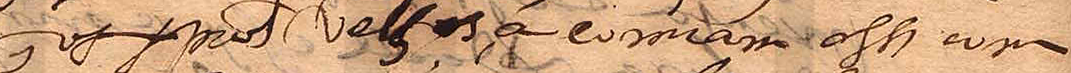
q̄ os xpaõs velhos á comiam assi com
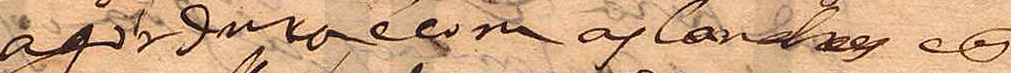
a gordura e com as landoes e q̄
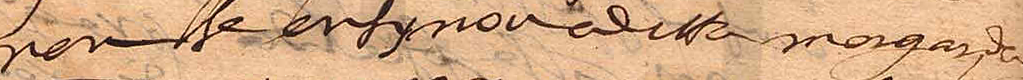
nan lhe ensynou a ditta margarjda
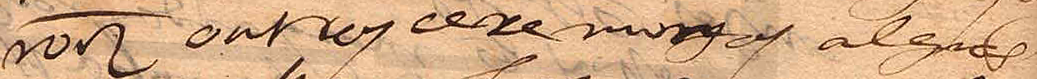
rōiz outras ceremonjas alguās
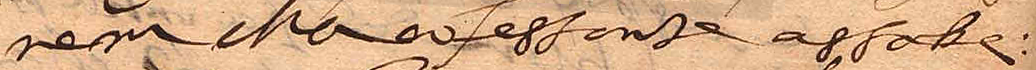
nem ella cofessante as sabe:
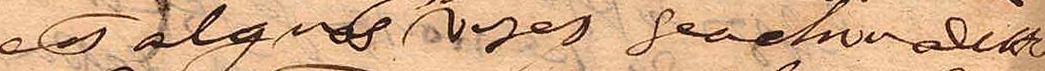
e q̄ alguās vezes se achou a ditta
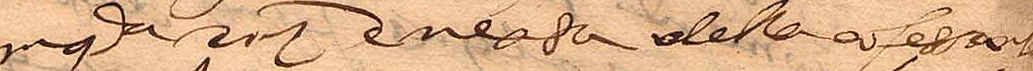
mgda roīz en casa della cofessante
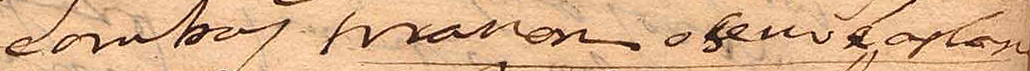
e ambas tirauan o seuo ē as lan
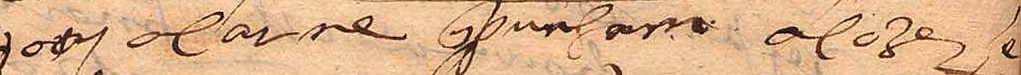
doas a carne q̄ punham a cozer e
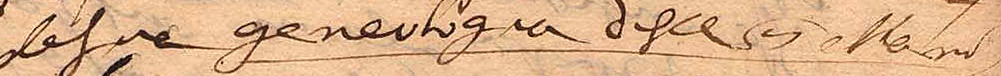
de sua geneologia disse q̄ ella nō
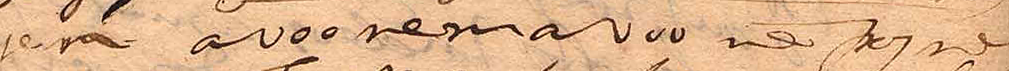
terá avoo nem avoo nē paj nē
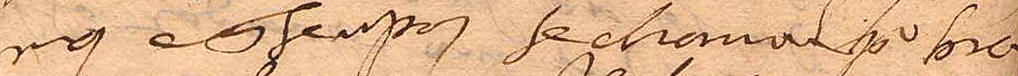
maj e q̄ seu paj se chamou po bra
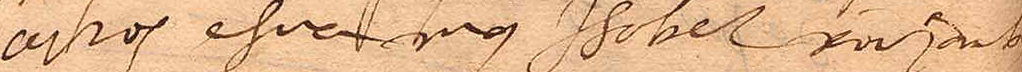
cejros e sua maj Jsabel rōiz anb
